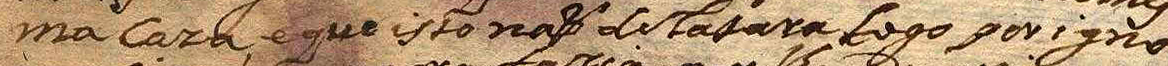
ma caza, e que isto naõ delatara Logo por igno
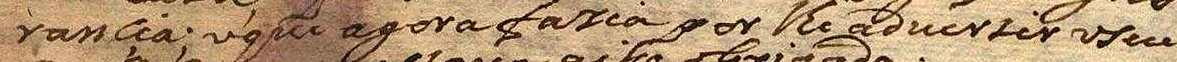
rancia; o que agora fazia por lhe aduertir o seu
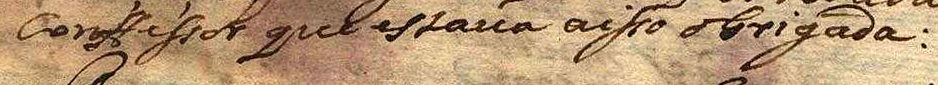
confessor que estaua a isso obrigada:
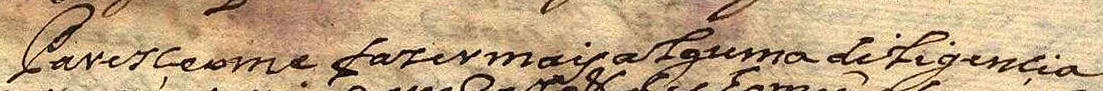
Paresceome fazer mais alguma diligencia,
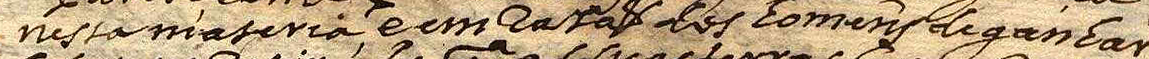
nesta materia e em razaõ dos homen̄s de ganhar
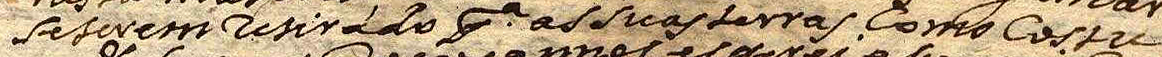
se terem Retirado p.a as suas terras. como costu
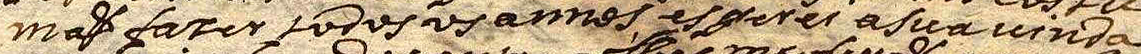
maõ fazer todos os annos, esperei a sua uinda
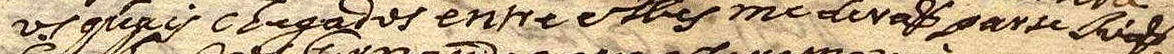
os quais chegados entre elles me deraõ parte Ioaõ
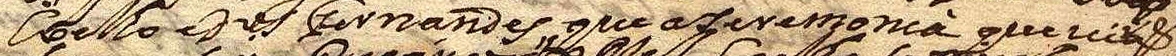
Coelho e D.os Fernandes que a seremonia que uiraõ
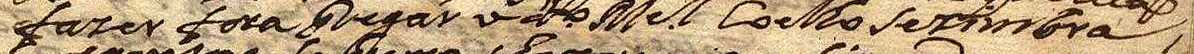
fazer fora pRegar o d̄.o M.el Coelho Sezimbra,
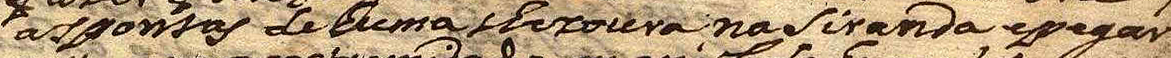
as pontas de huma thezoura na siranda e pegar
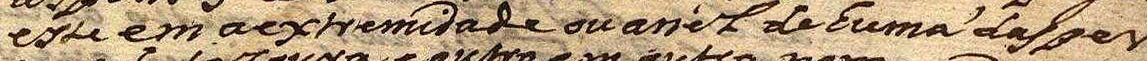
este em a extremidade ou anél de huma das per
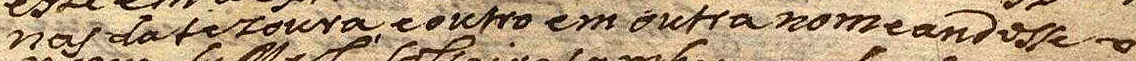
nas da tezoura, e outro em outra nomeandosse o
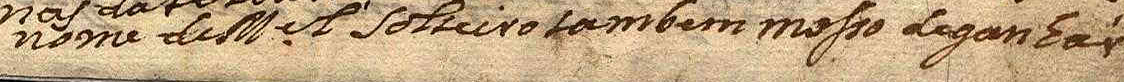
nome de M.el solteiro tambem mosso de ganhar
